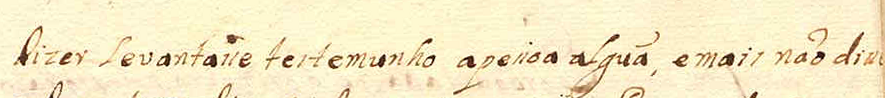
dizer levantasse testemunho a pessoa alguā, e mais naõ disse
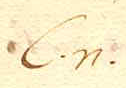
C. n.
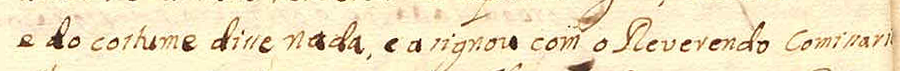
e do costume disse nada, e asignou com o Reverendo Comissario
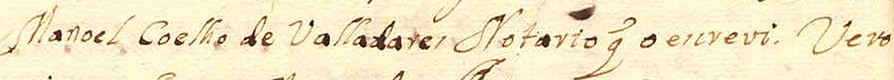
Manoel Coelho de Valladares Notario q̄ o escrevi. Vero
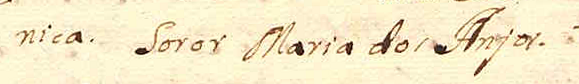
nica. Soror Maria dos Anjos.
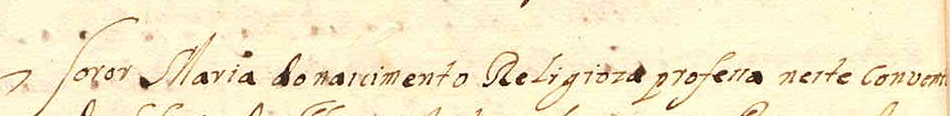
Soror Maria do nascimento Religioza professa neste convent
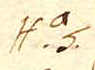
tta. 5.
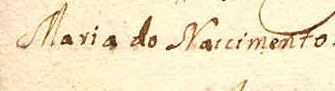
Maria do Nascimento.
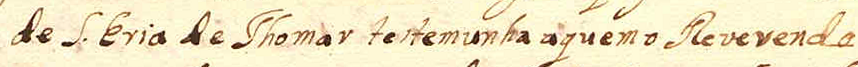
de S. Eria de Thomar testemunha a quem o Reverendo
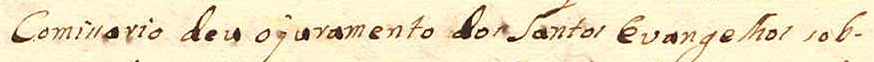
Comissario deu o juramento dos Santos Evangelhos sob
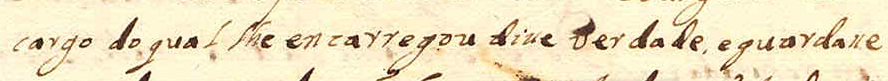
cargo do qual lhe encarregou disse verdade, e guardasse
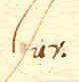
Jur.
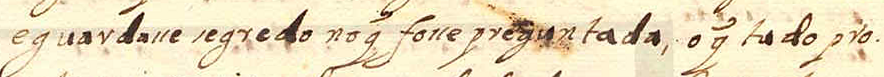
e guardasse segredo no q̄ fosse preguntada, o q̄ todo pro
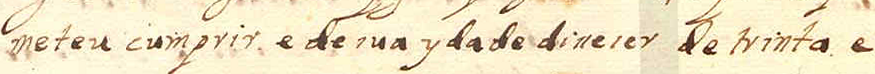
meteu cumprir e de sua ydade disse ser de trinta e
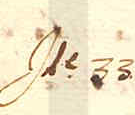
Jd.e 33
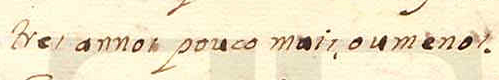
tres annos pouco mais, ou menos.
